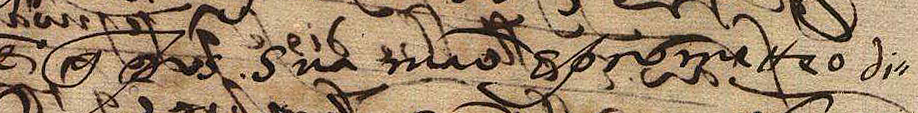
ē q̄ pos sua mão E prometteo di
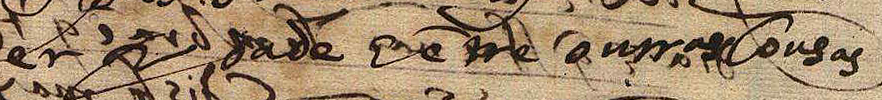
zer ꝟdade E ētre outras Cousas
